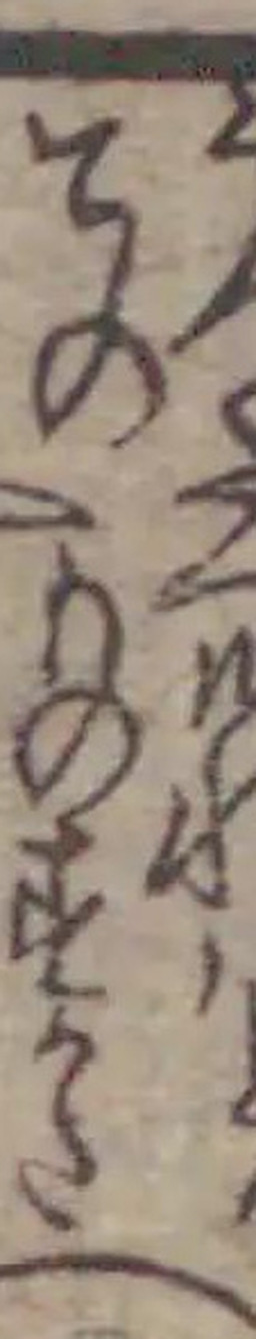てのものすかた
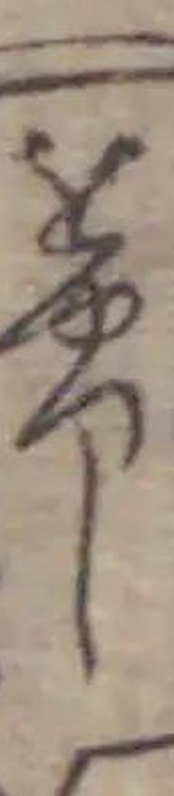をやつし
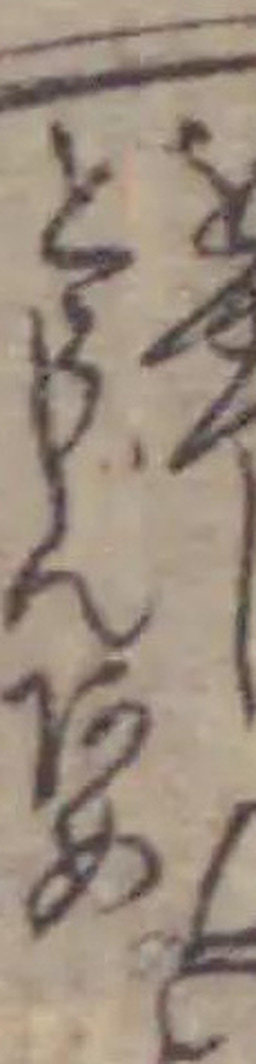とうじんあめ
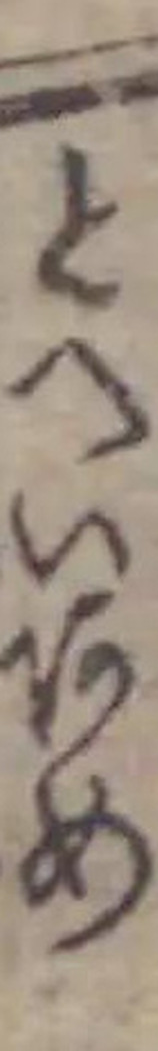とへいあめ
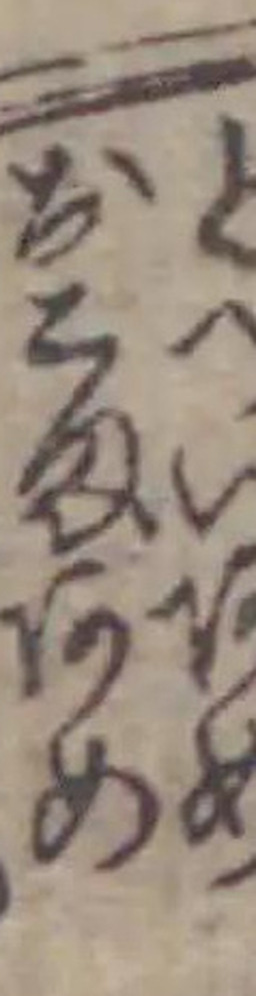おこたあめ
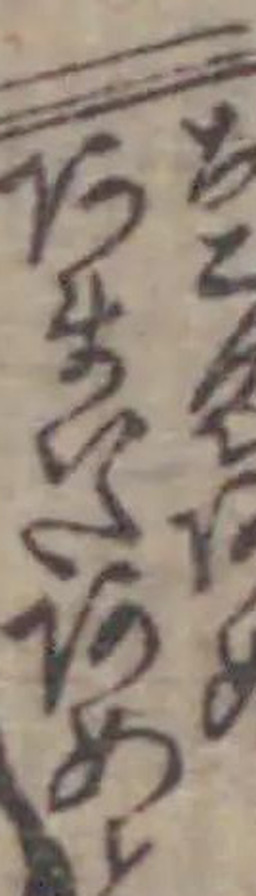あまいたあめと
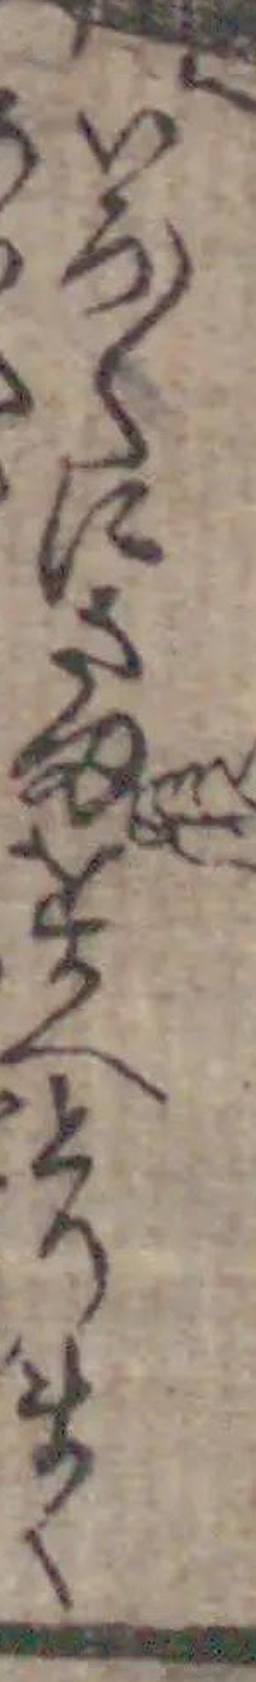いろ〳〵にさまをかへとりまく
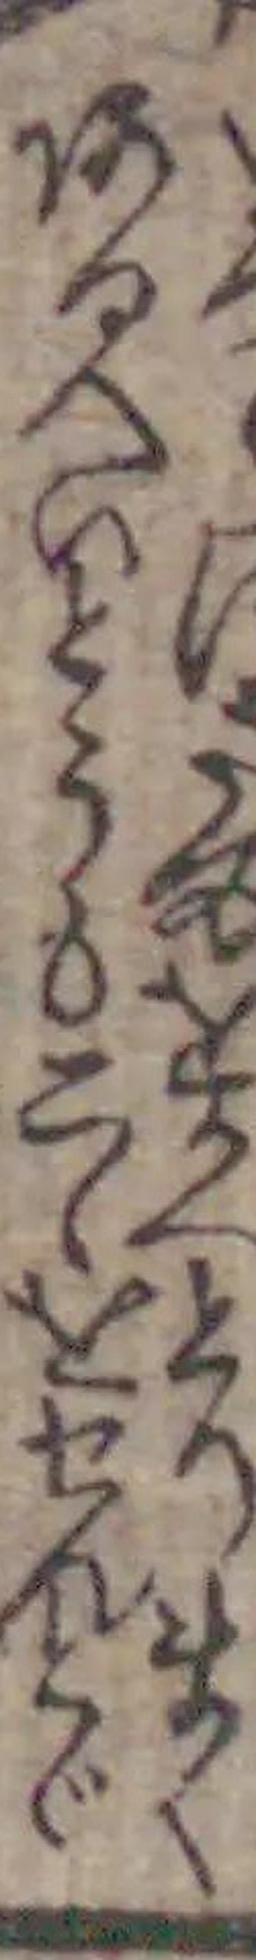あるへいとうもこゝをせんとゞ
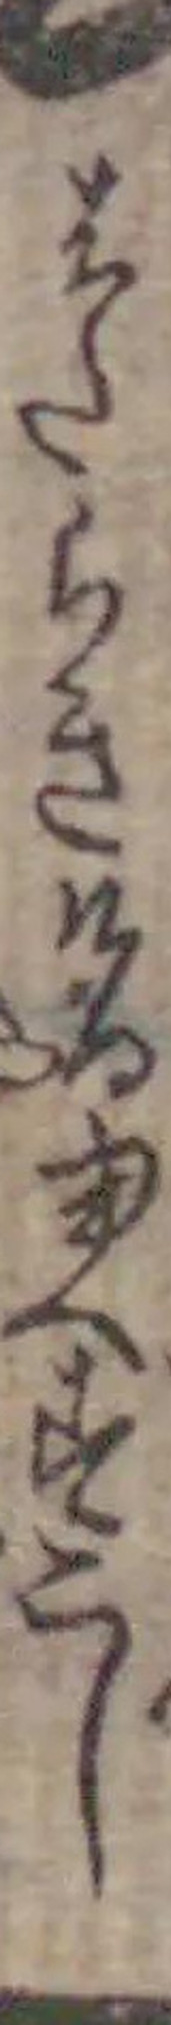はたらきけるゆへすこし
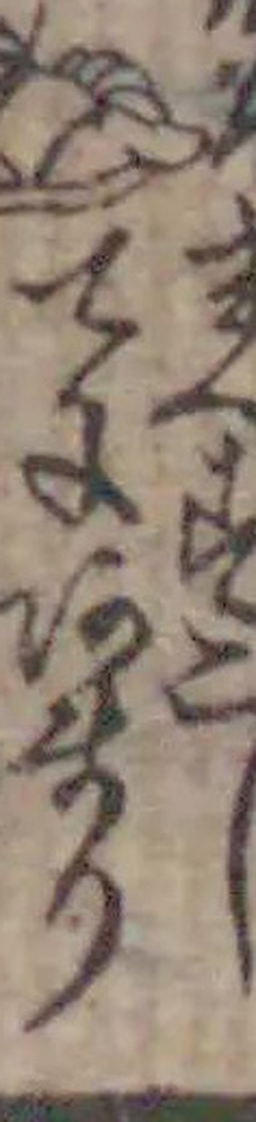てにあまり
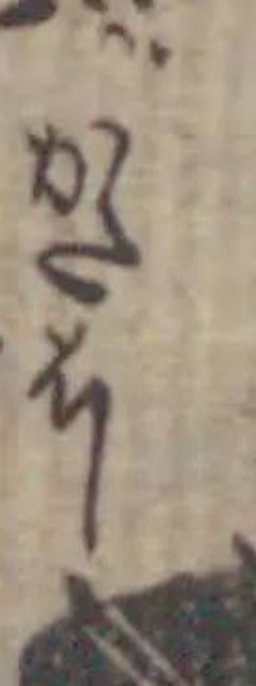かたはし
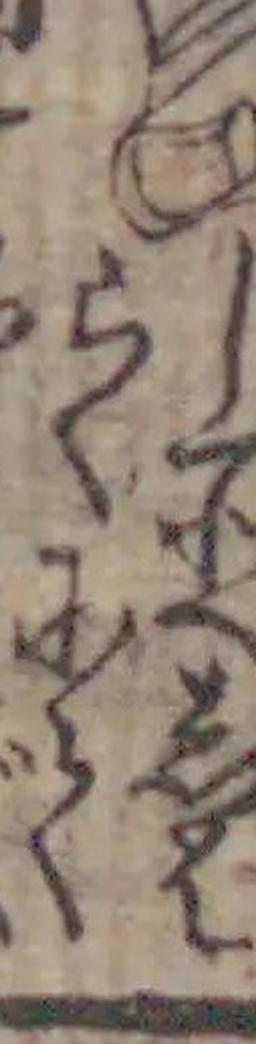らくにて
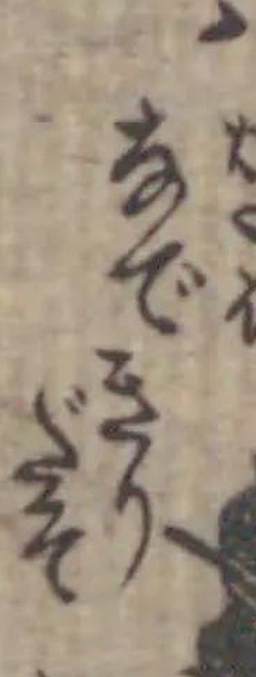なできり
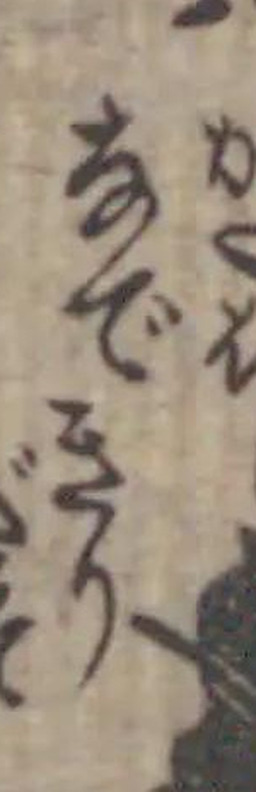なできり
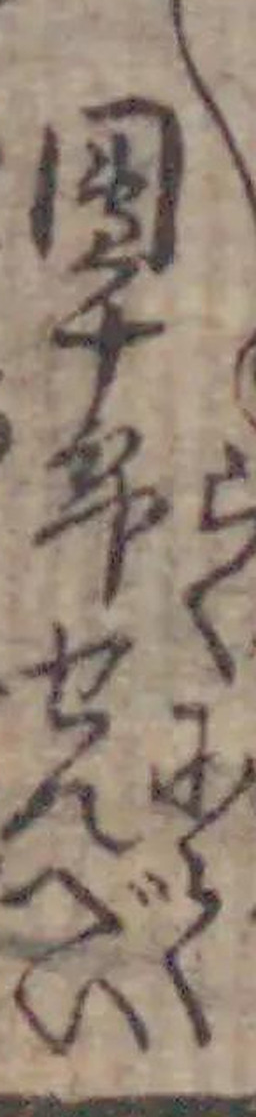団十郎せんべい
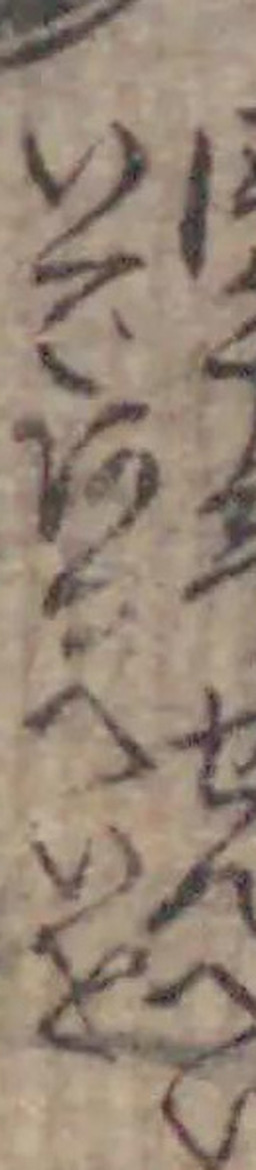いであるへいを
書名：名代干菓子山殿 3巻
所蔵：国立国会図書館 National Diet Library, JAPAN
